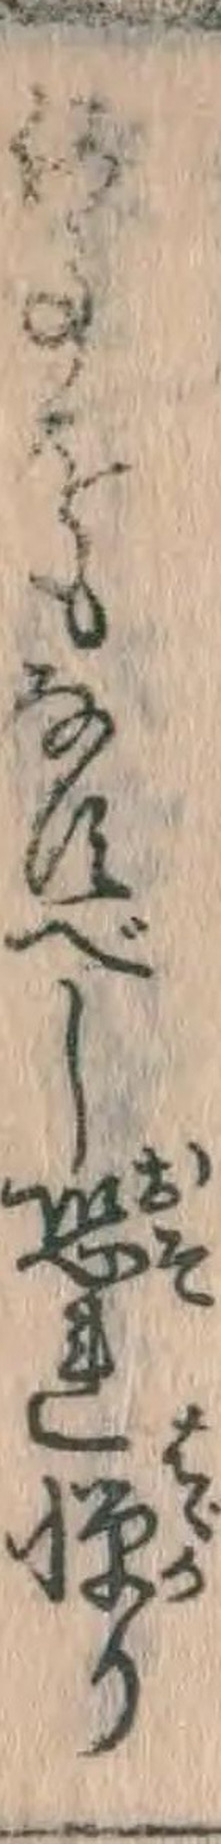何事をもなすべし恐れ憚り
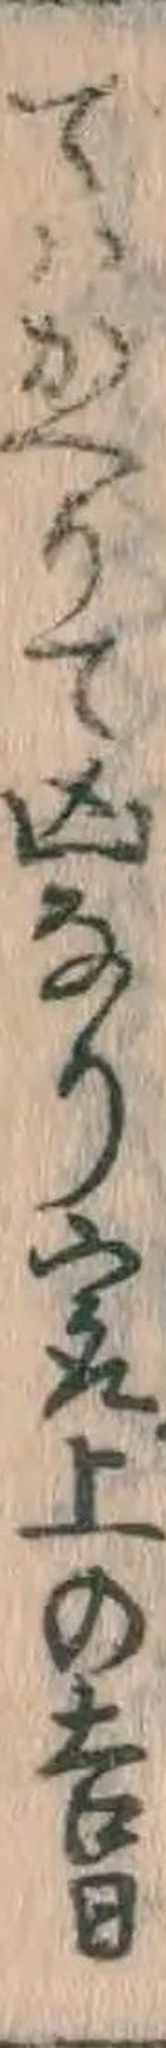てはかへりて凶なり最上の吉日
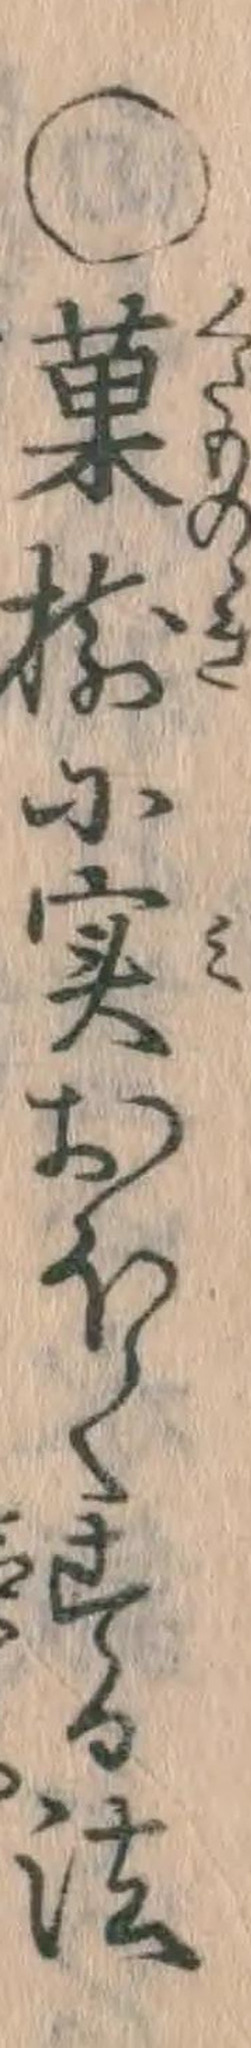○菓樹に実おほくする法
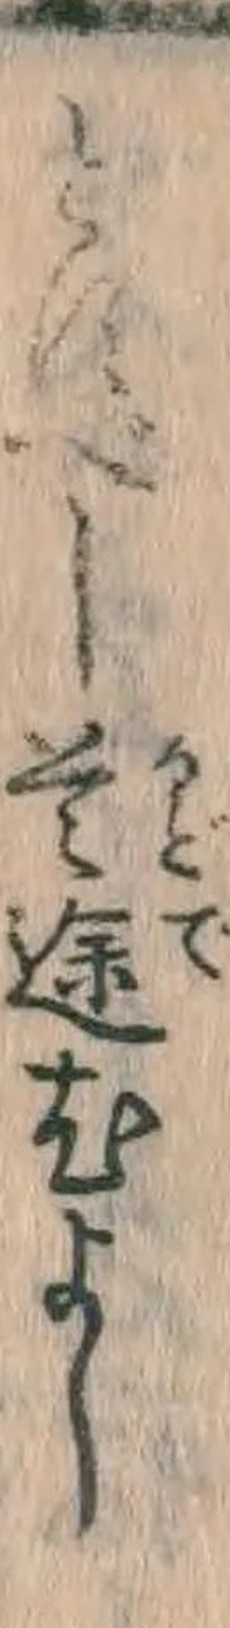とすべし首途尤よし
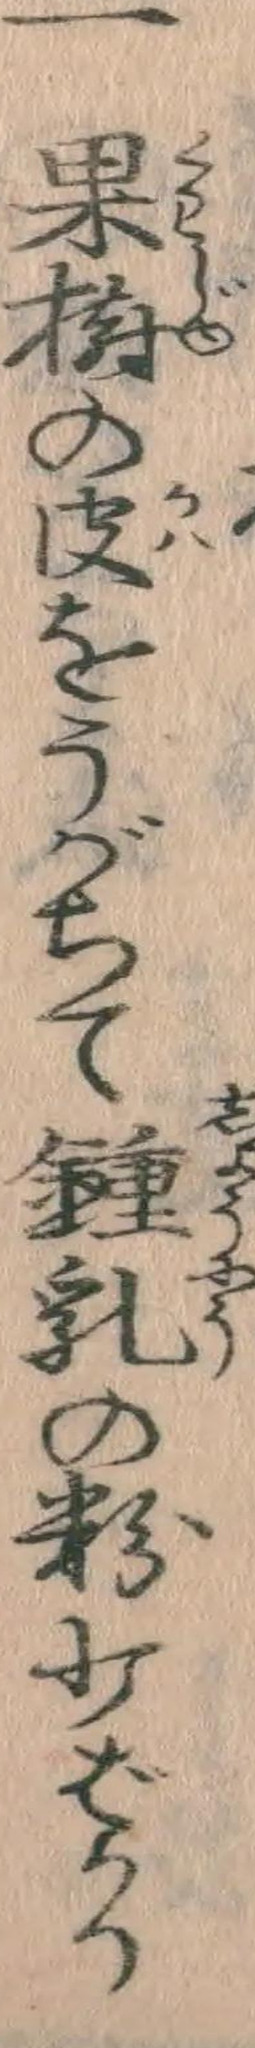一果樹の皮をうがちて鍾乳の粉少ばかり
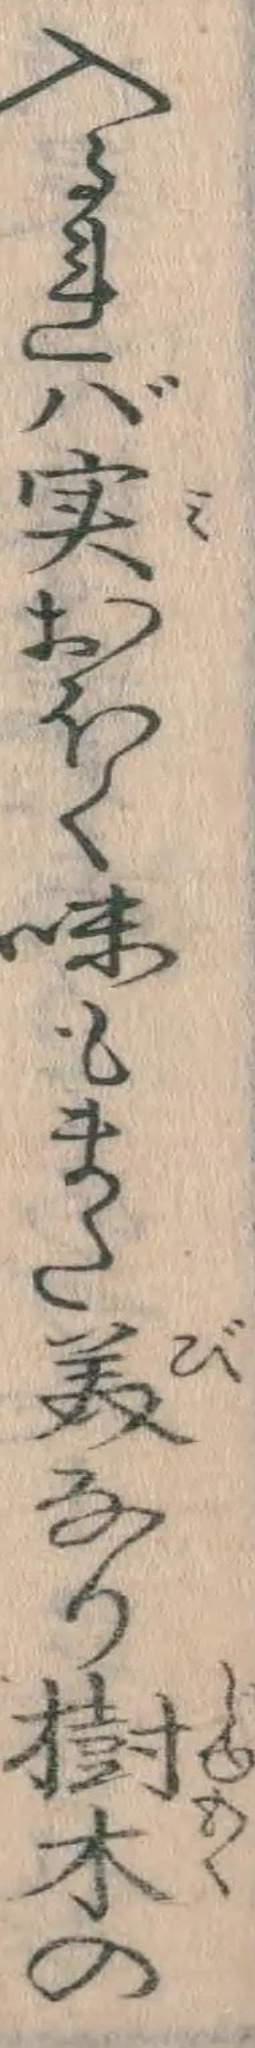入るれば実おほく味もまた美なり樹木の
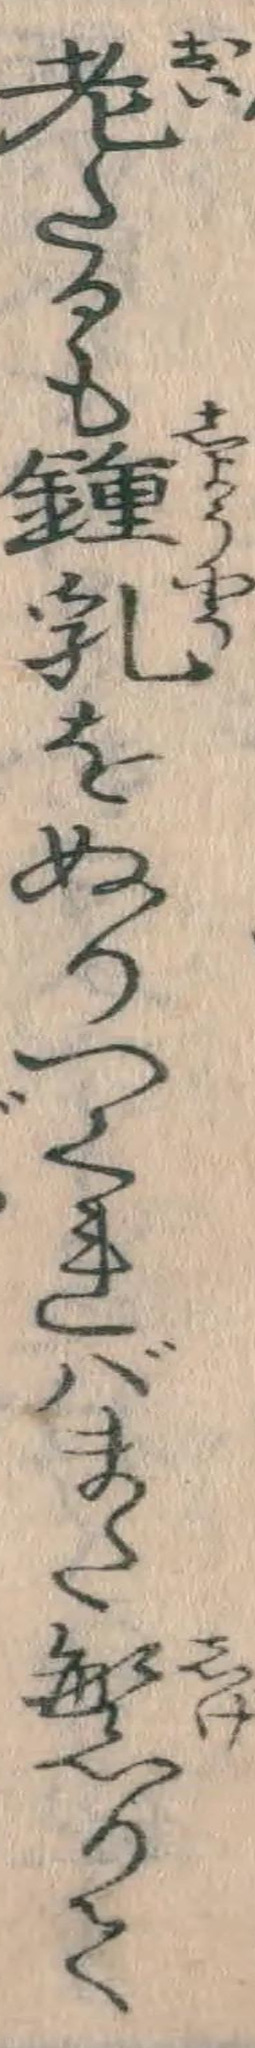老たるも鍾乳をぬりつくればまた繁りて
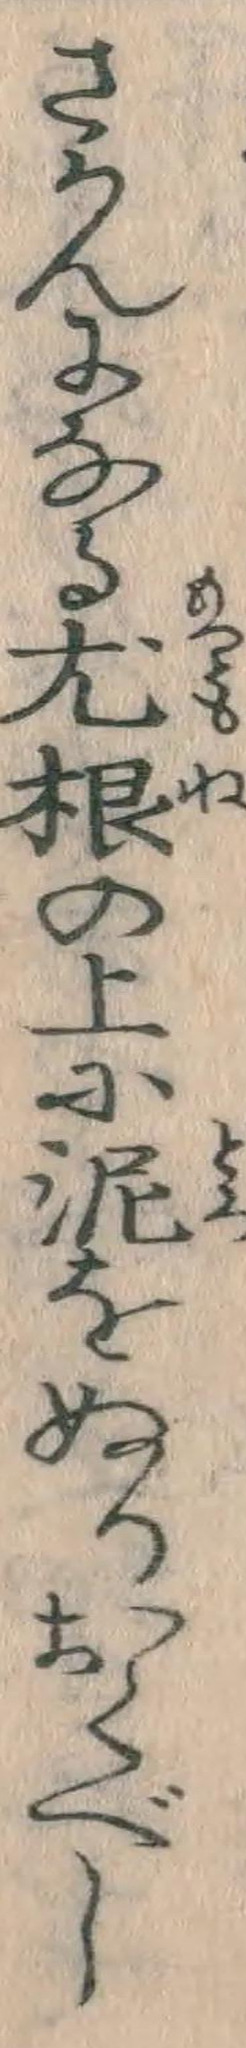さかんになる尤根の上に泥をぬりおくべし
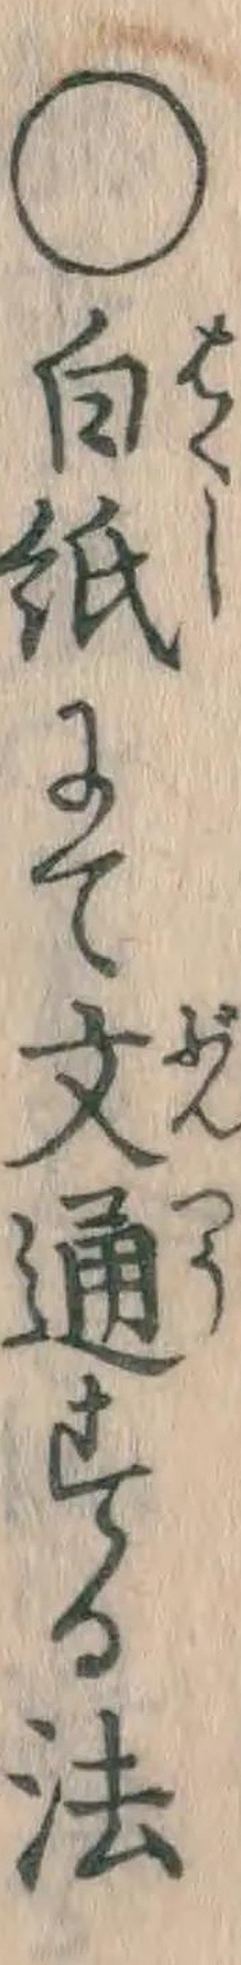○白紙にて文通する法
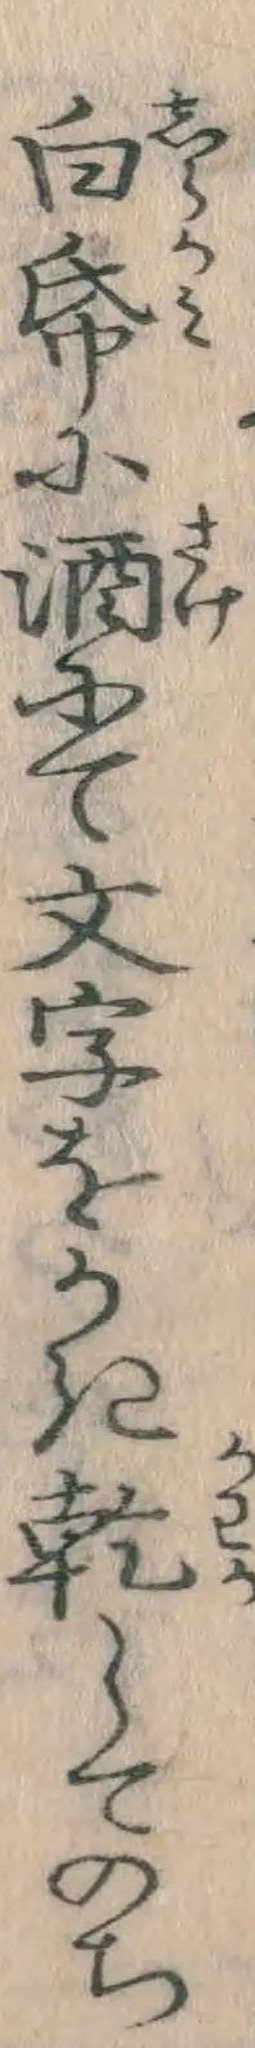一白紙に酒にて文字をかき乾してのち
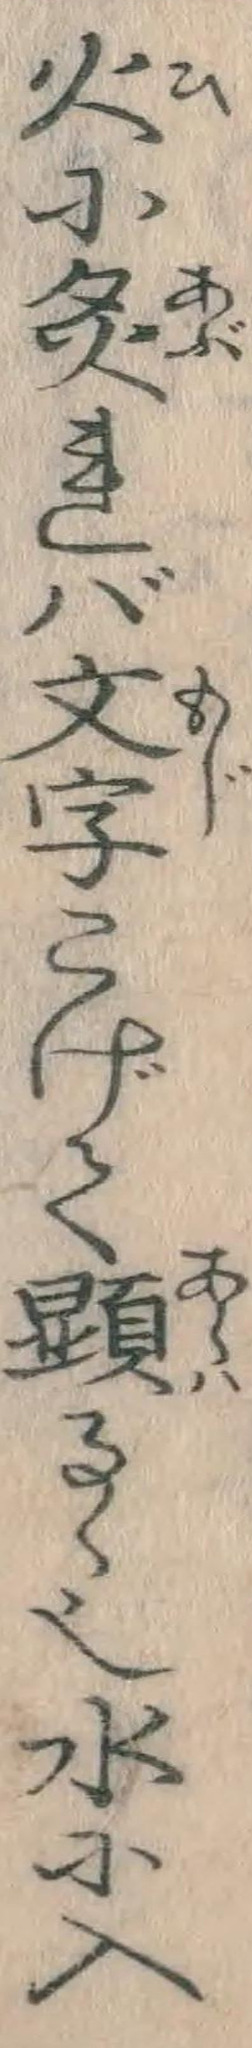火に炙れば文字こげて顕るゝ也水に入
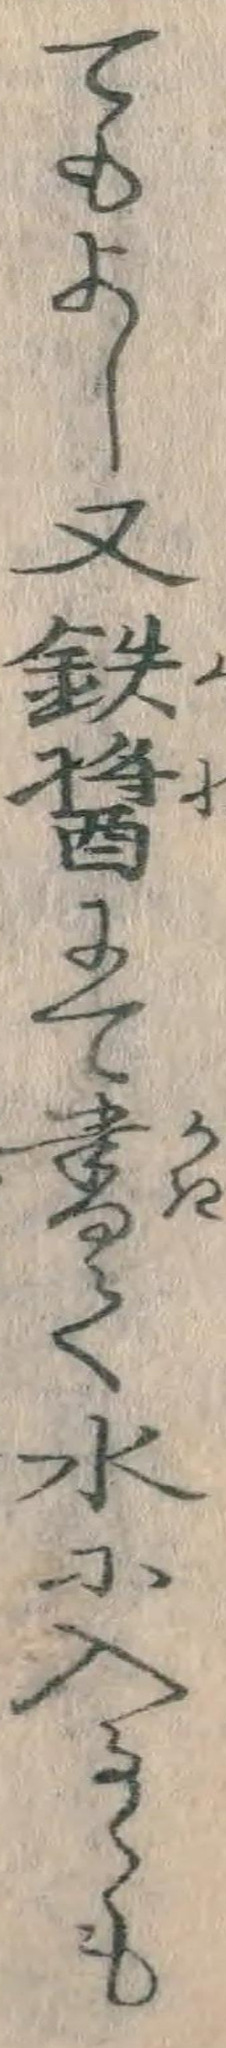てもよし又鉄醬にて書て水に入るゝも
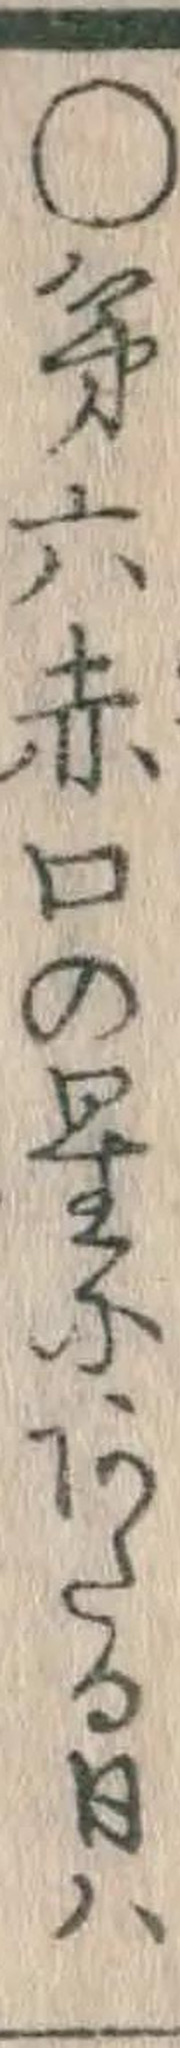○第六赤口の星にあたる日は
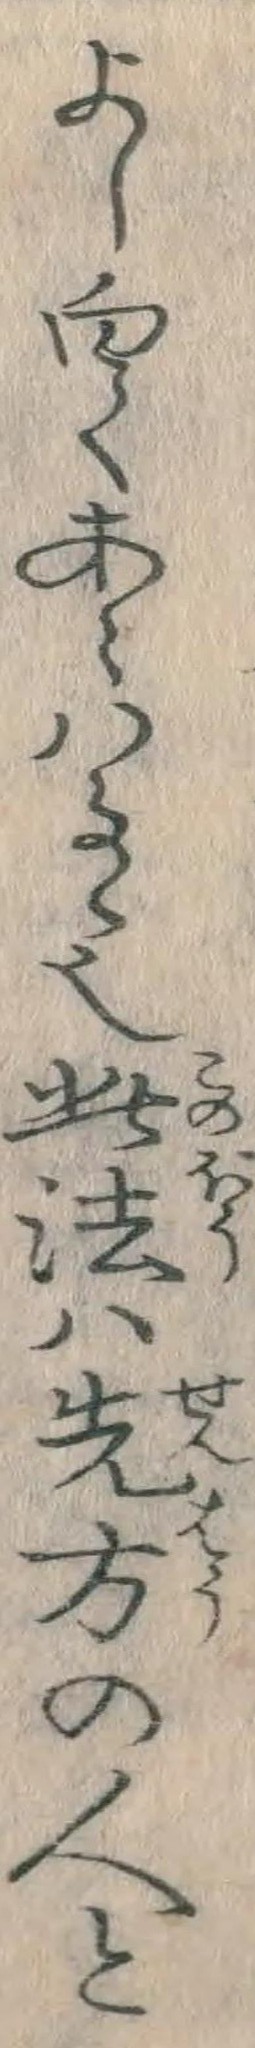よし白くあらはるゝ也此法は先方の人と
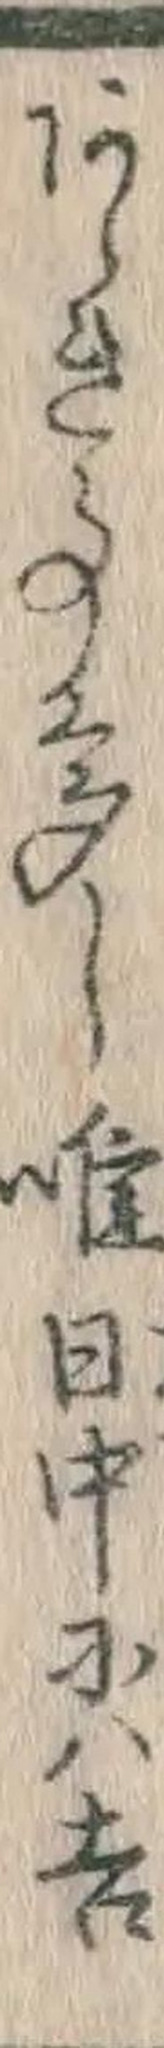あしき事多し唯日中には吉
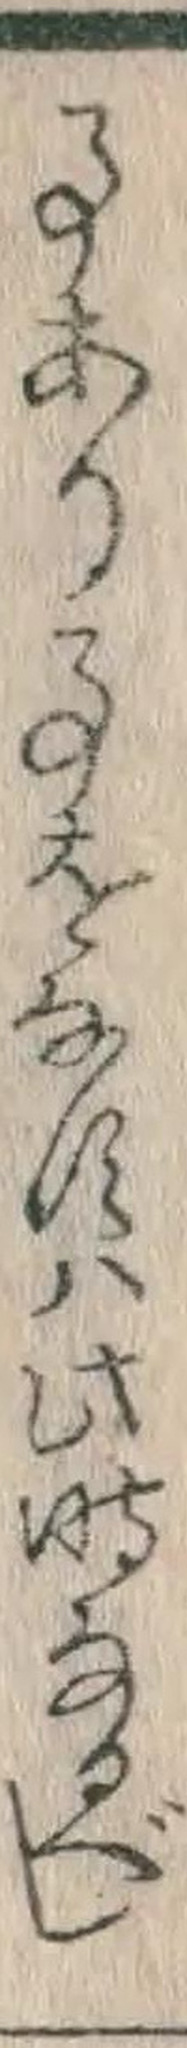事あり事をなすは此時なるべし
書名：広益秘事大全 3巻. [2]
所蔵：国立国会図書館 National Diet Library, JAPAN
